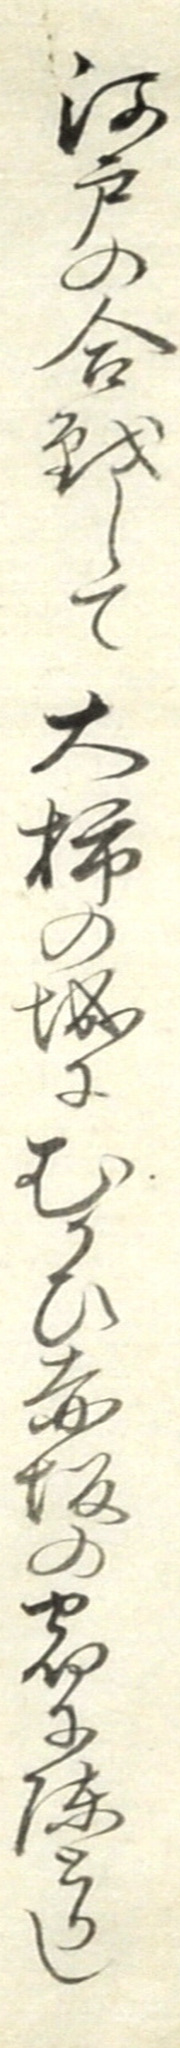江戸の合戦して大柿の城にむかひ赤坂の宿に陣とりし
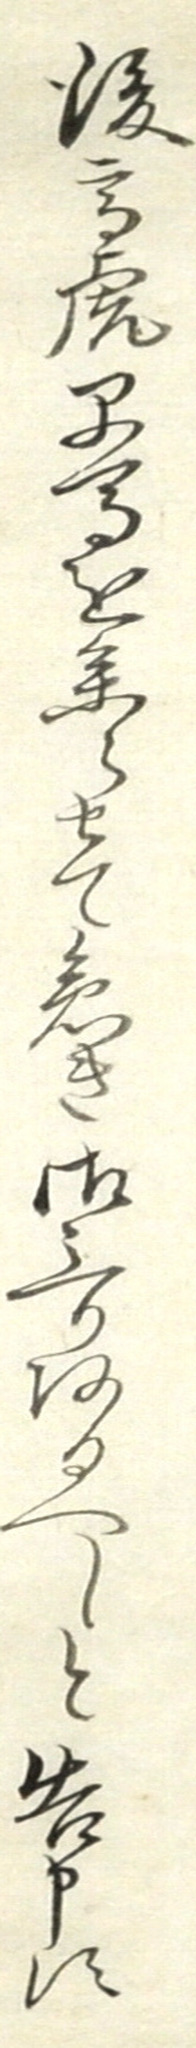後高虎早馬を参らせて急き御上りあるへしと告申す
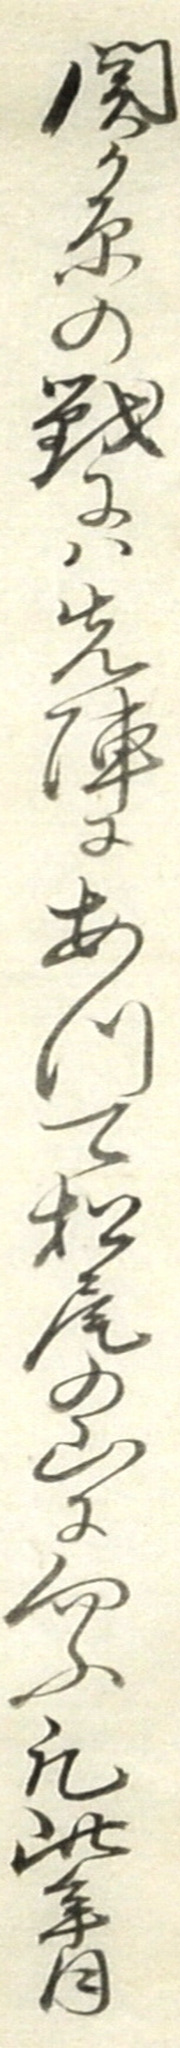関か原の戦には先陣にあつて松尾の山に向ふ凡此年月
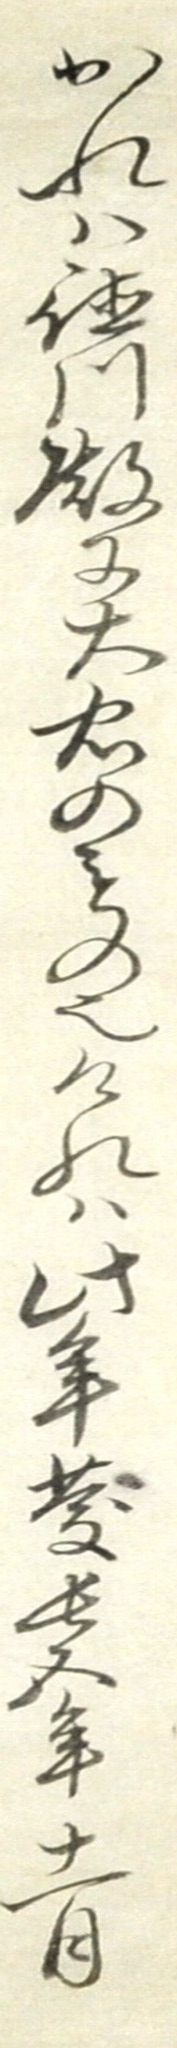かれは徳川殿に大忠のもの也けれは此年慶長五年十一月
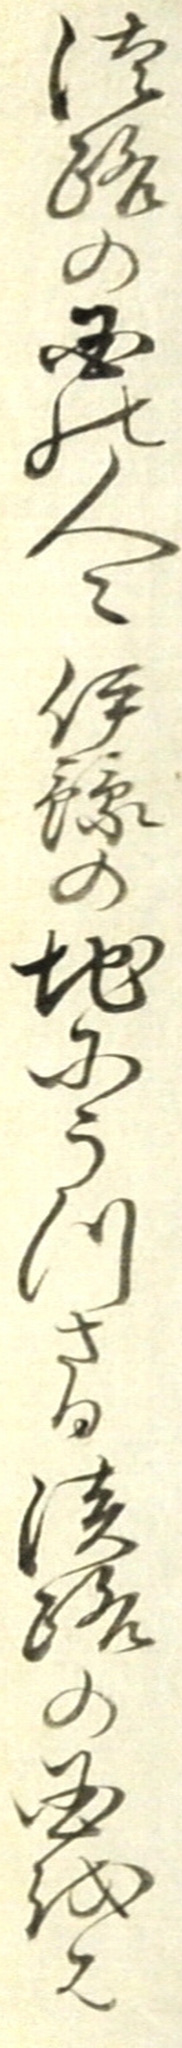淡路の国の人々伊予の地にうつさる淡路の国をは

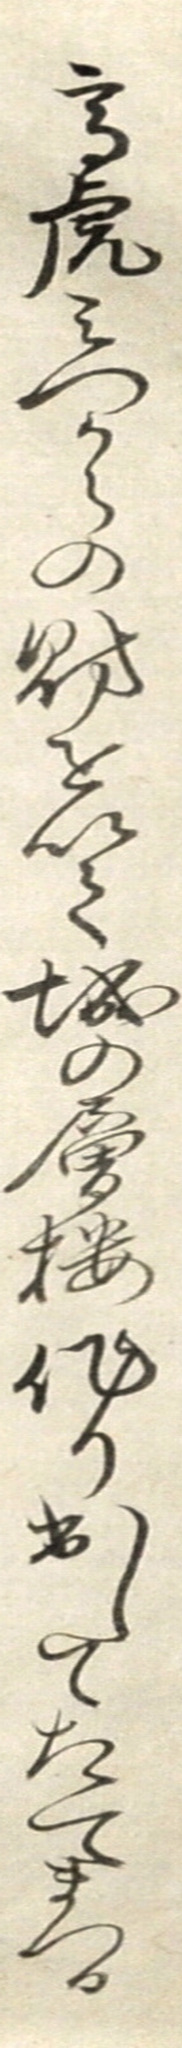高虎みつからの財を以て城の層楼作り出してたてまつる
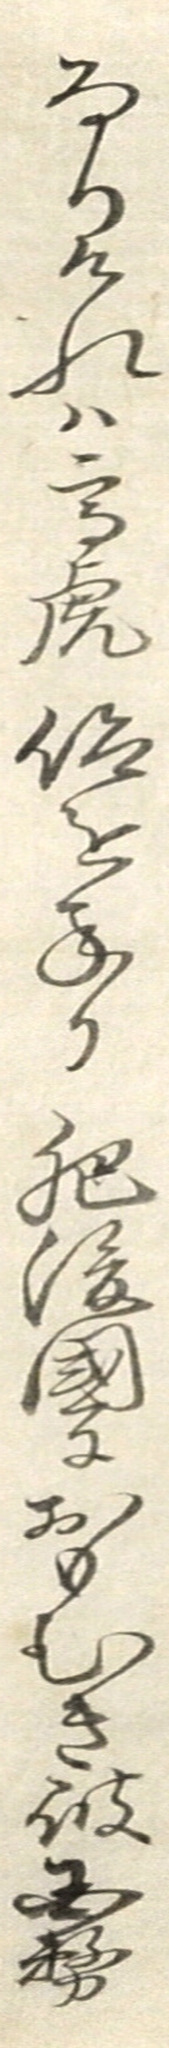なりけれは高虎仰を承り肥後国におもむき彼国務
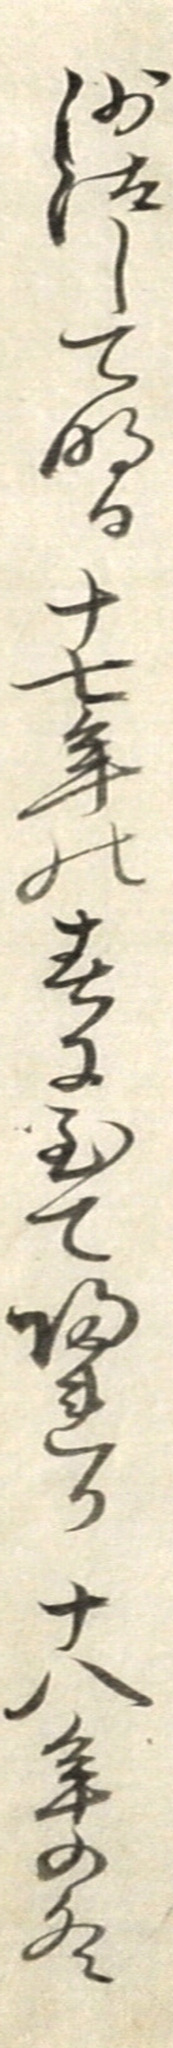沙汰して明る十七年の春に至て帰れり十八年の冬
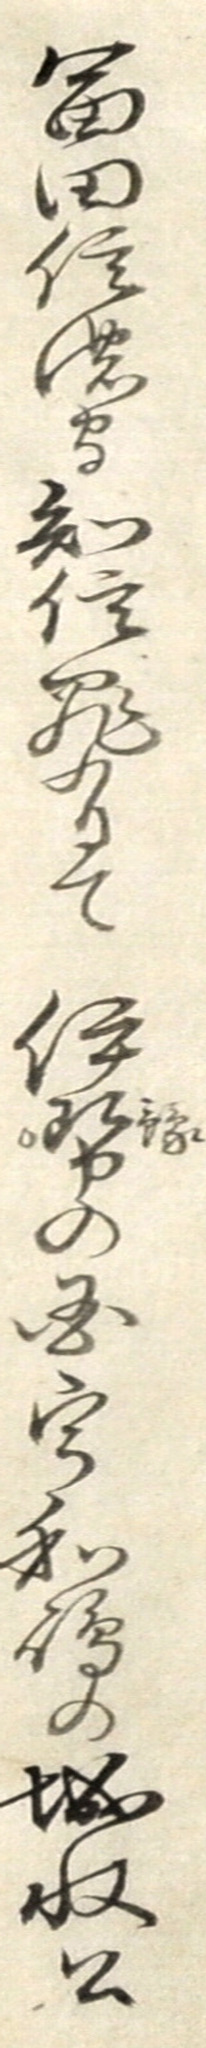富田信濃守知信罪有て伊勢の国宇和島の城收公
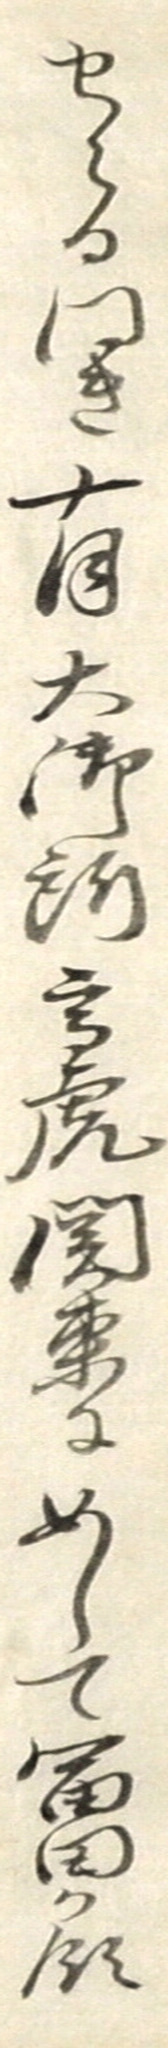せらる同き十月大御所高虎関東にめして富田か領
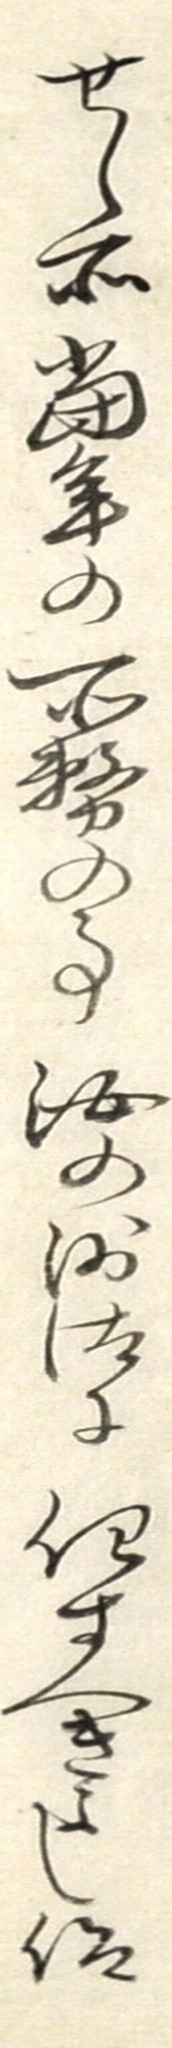せし所当年の所務の事汝の沙汰に任すへきよし仰
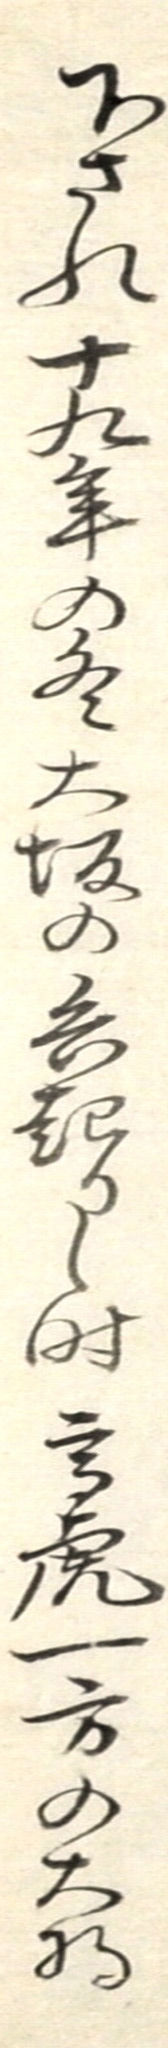下され十九年の冬大坂の兵起りし時高虎一方の大将
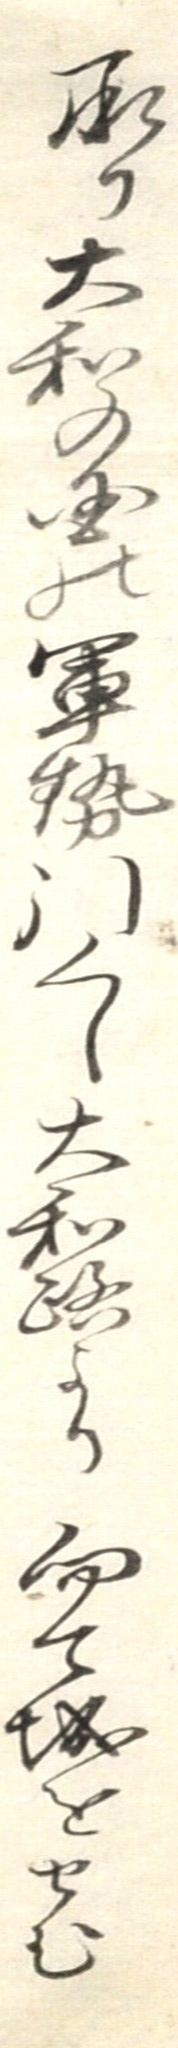承り大和の国の軍勢引くし大和路より向て城をせむ
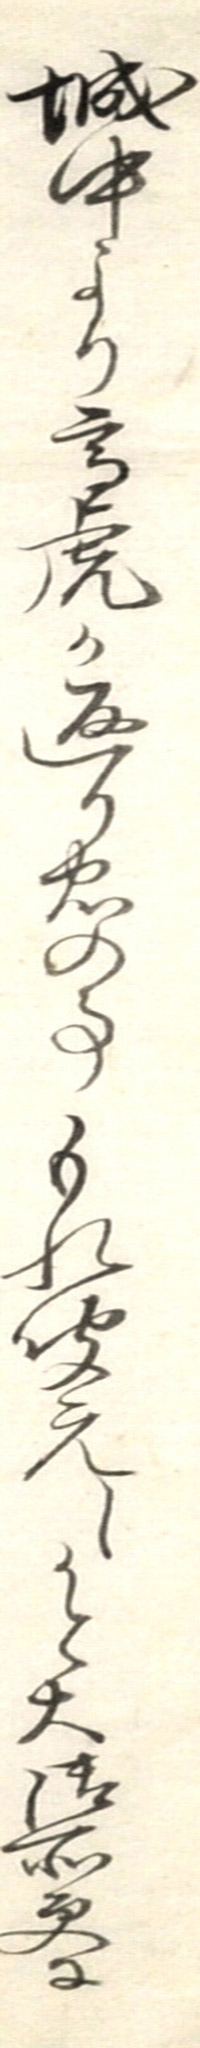城中より高虎か返り忠の事もれ聞えしかと大御所更に
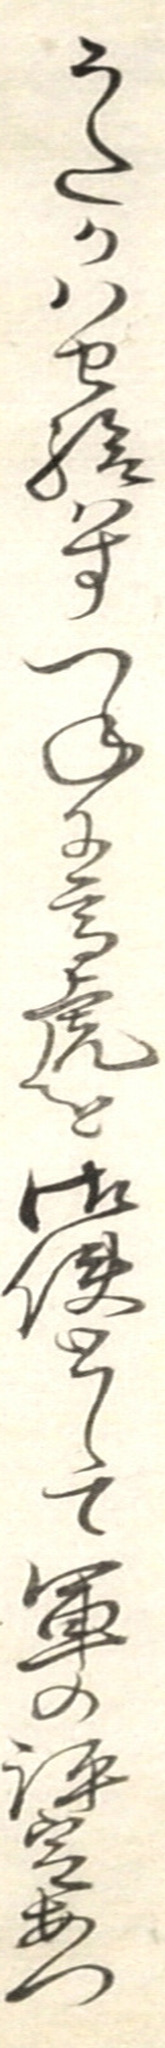うたかはせ給はすつねに高虎を御使として軍の評定あつ
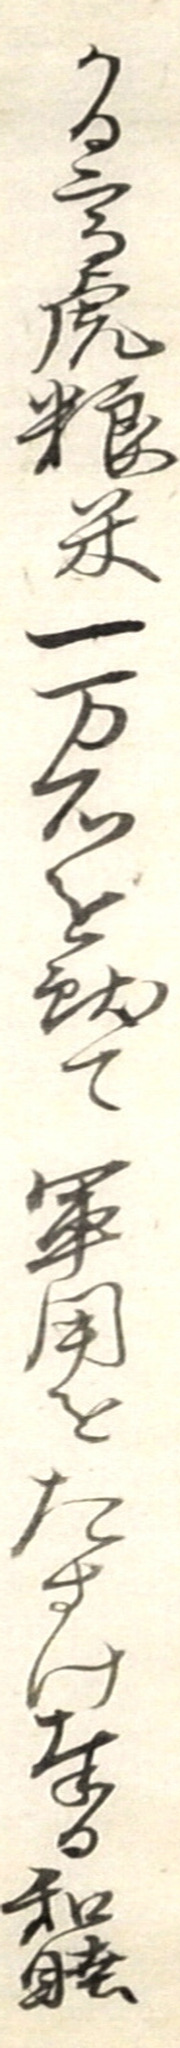かる高虎粮米一万石を献て軍用をたすけ奉る和睦
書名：藩翰譜（七・下）
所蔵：伊那市立高遠町図書館・合同会社AMANE
